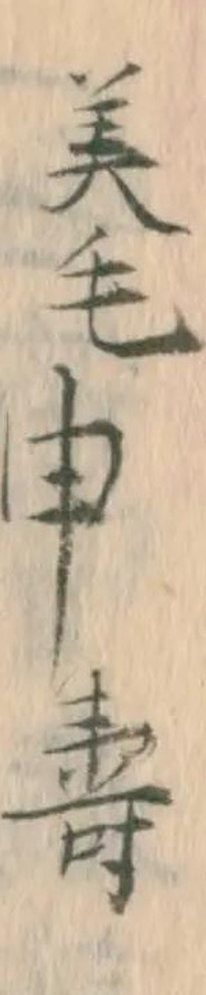美毛申壽
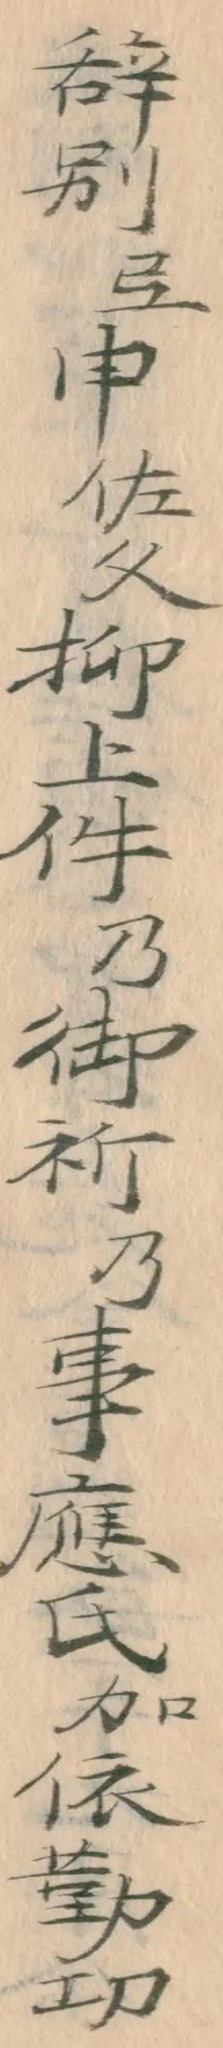辞別弖申佐久抑上件乃御祈乃事應氏加依勤功
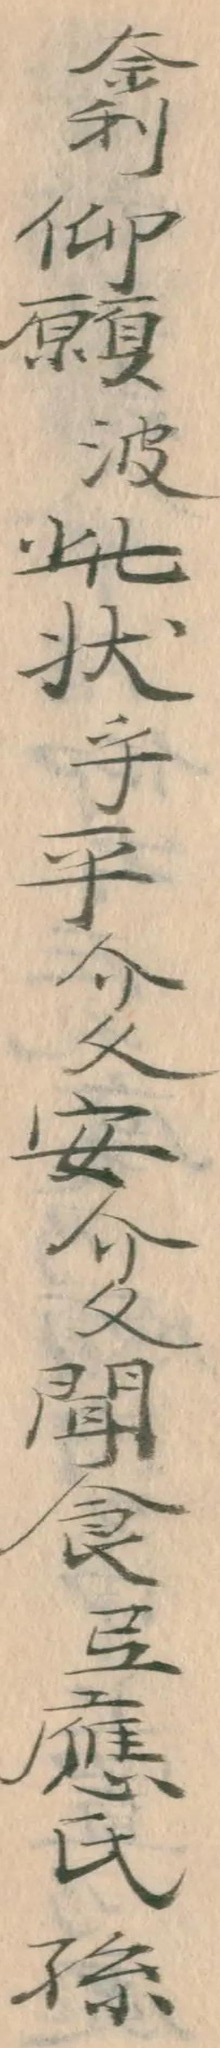奈利仰願波此状乎平介久安介久聞食弖應氏孫
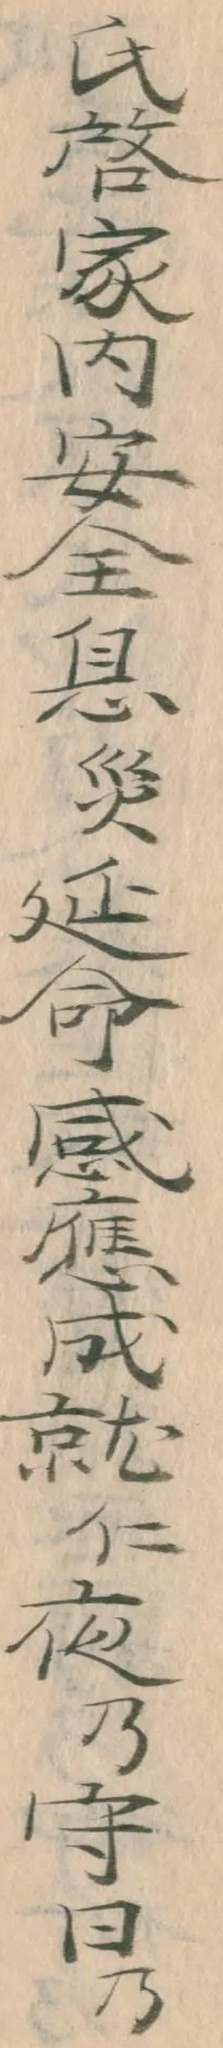氏啓家内安全息災延命感應成就仁夜乃守日乃
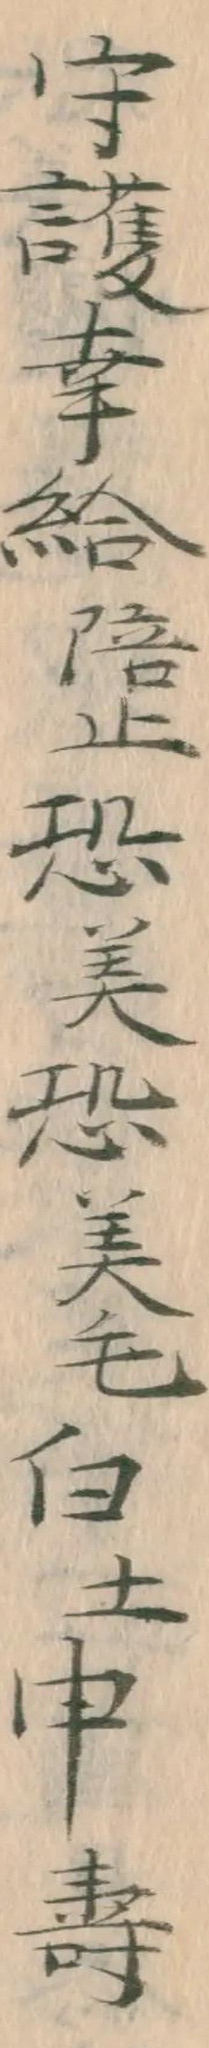守護幸給陪止恐美恐美毛白土申壽
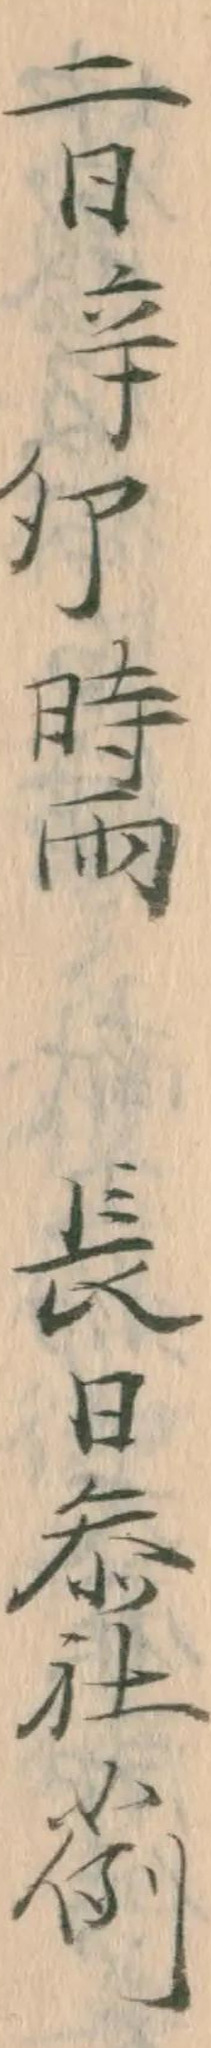二日辛卯時雨長日参社如例
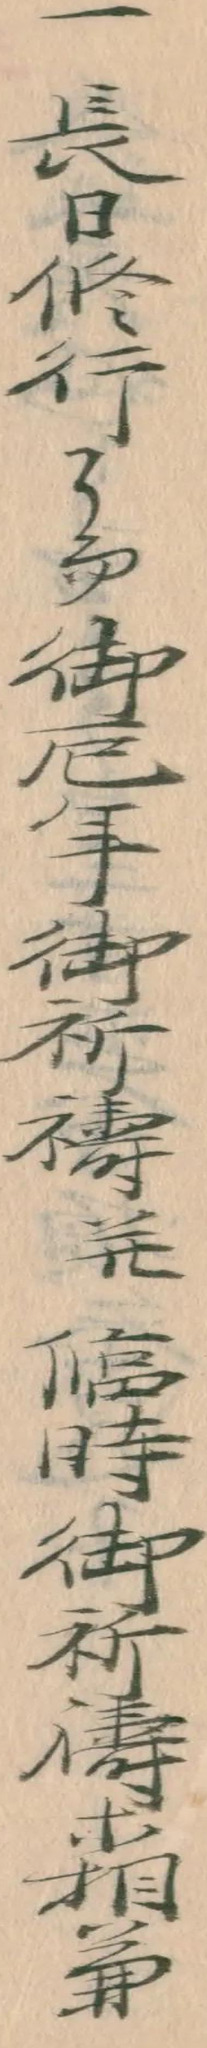一長日修行了而御厄年御祈祷并臨時御祈禱等相兼
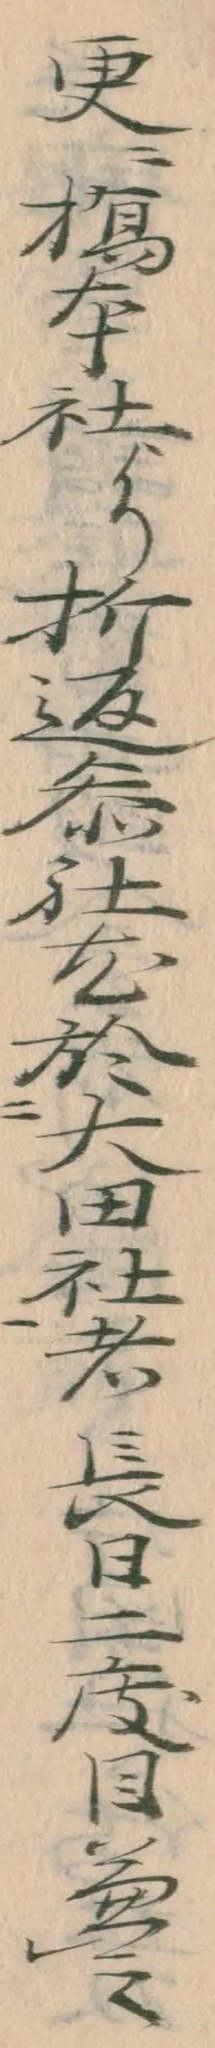更ニ橋本社より折返参社尤於大田社者長日二度目兼之
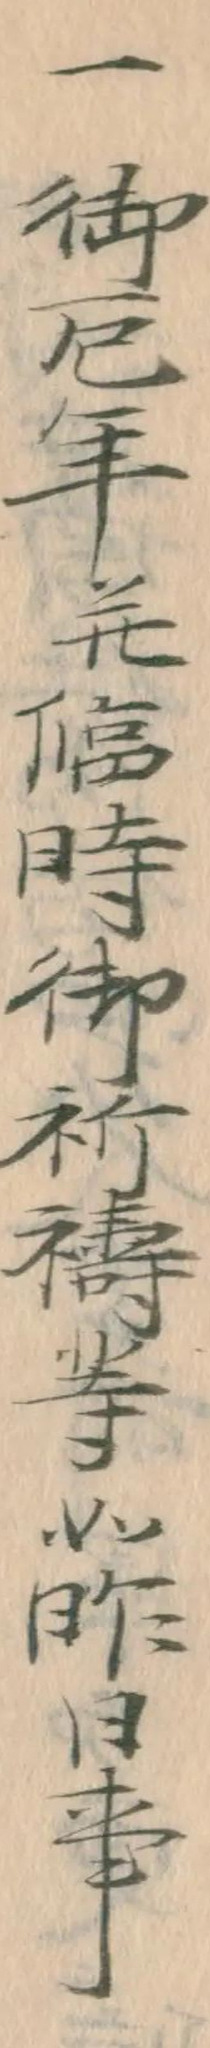一御厄年幷臨時御祈祷等如昨日事
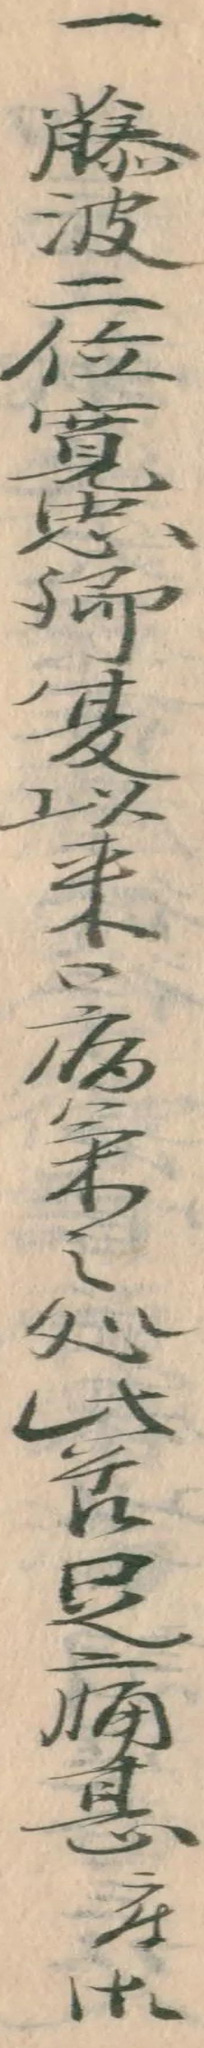一藤波二位寛忠卿夏以来御病氣之処此節足痛甚ニ付御
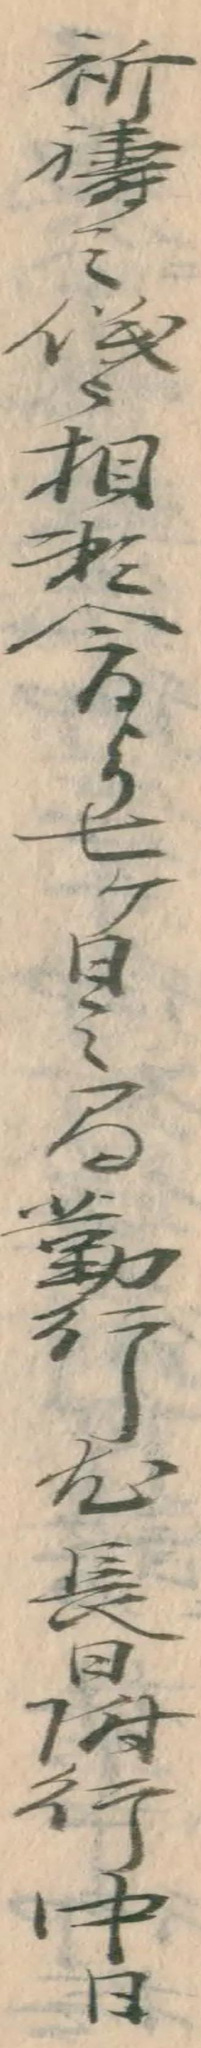祈祷之儀被相頼今日より七ケ日之間勤行尤長日附行中日
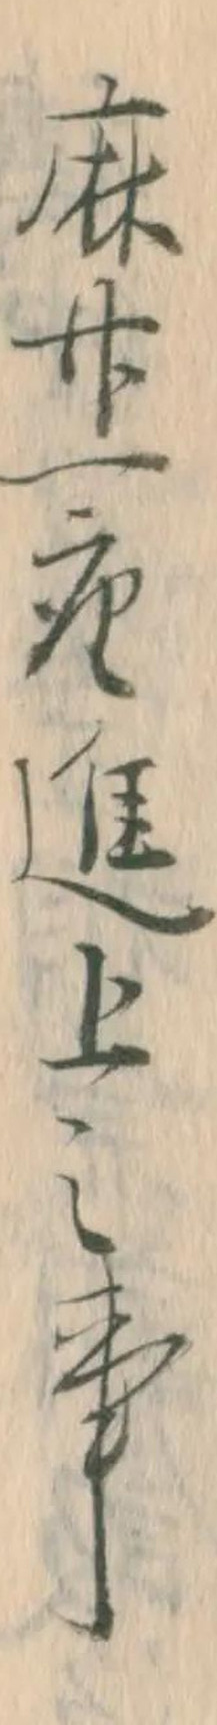麻廿一座進上之事
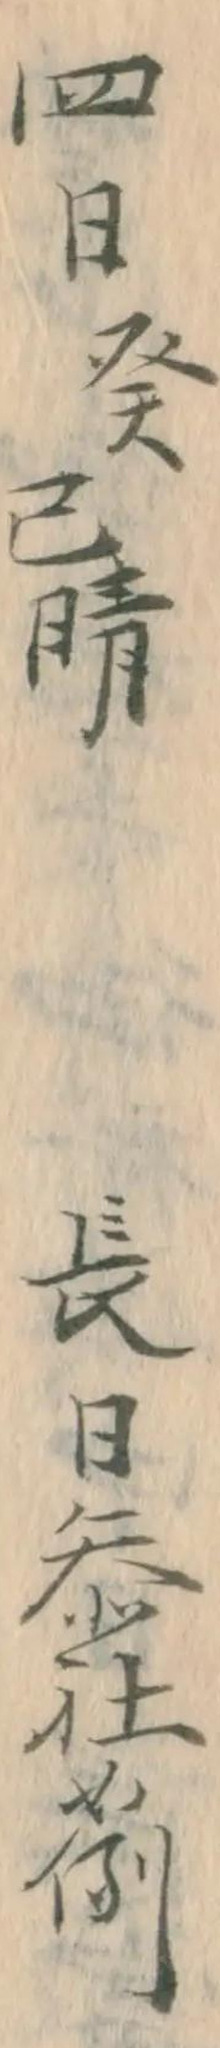四日癸巳晴長日参社如例

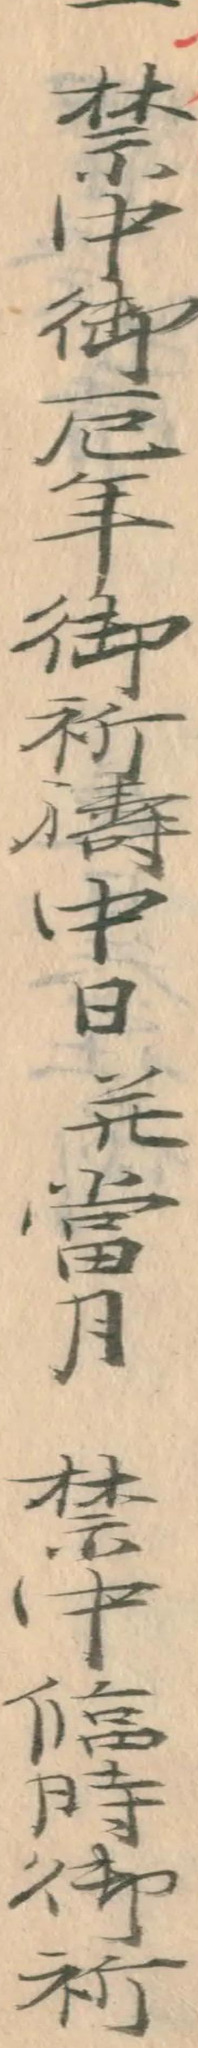一禁中御厄年御祈祷中日并當月禁中臨時御祈
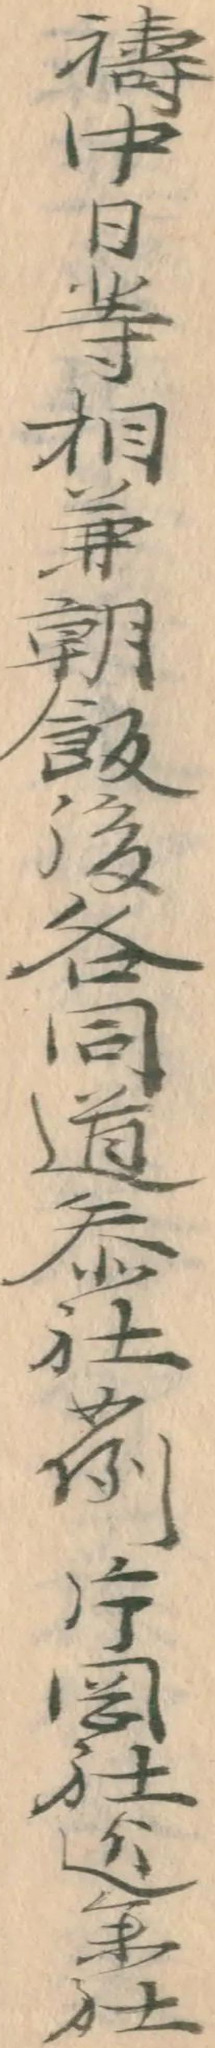祷中日等相兼朝飯後各同道泰社如例片岡社迄参社
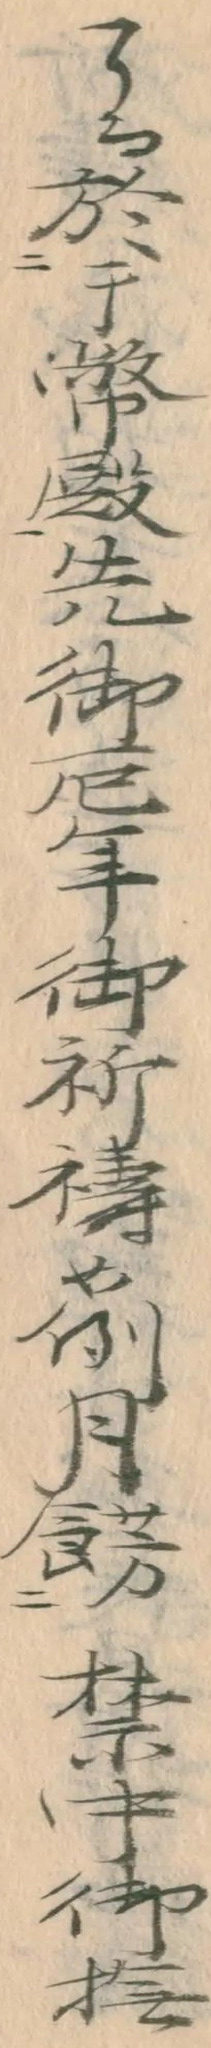了而於于幣殿先御厄年御祈祷如例月餝禁中御撫
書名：賀茂社記録. 第74冊
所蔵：国立国会図書館 National Diet Library, JAPAN
